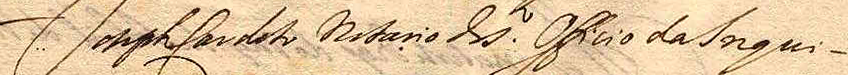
Joseph Cardoso Notario do s.to Officio da Inqui
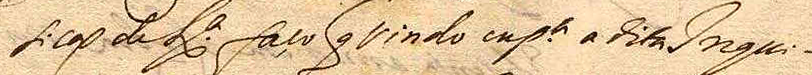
siçaꝭ de Lx.a faço q̄ vindo eu p.a a dita Inqui
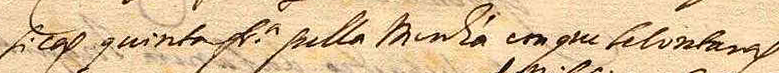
siçaꝭ quinta fr.a pella Menhā em que se contaraꝭ
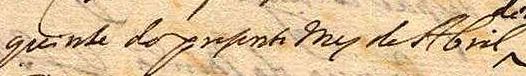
quinse do presente mes de Abril
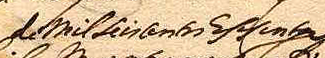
de mil seiscentos E sesenta
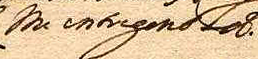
me entregou o Ld.o
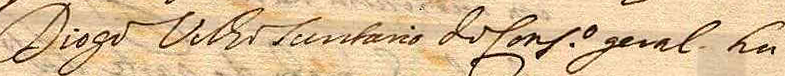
Diogo Velho Secretario do Cons.o geral hū
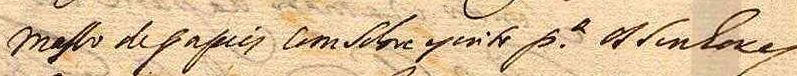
masso de papeis com sobre escrito p.a os Senhores
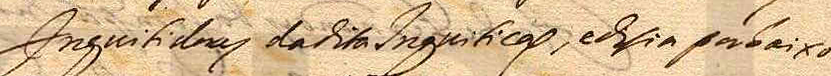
Jnquisidores da dita Inquisiçaꝭ, e disia por baixo
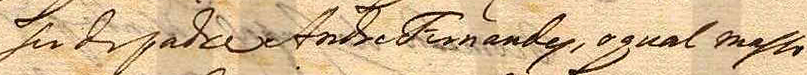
ser do padre Andre Fernandes, o qual masso
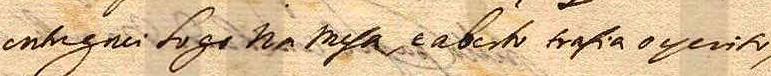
entreguei Logo na mesa, e aberto trasia o escrito,
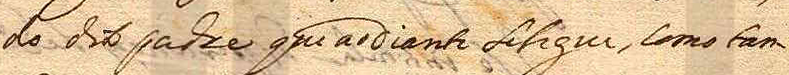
do dito padre que ao diante se segue, como tam
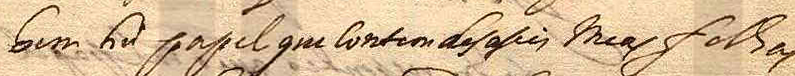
bem hū papel que contem desaseis meas folhas
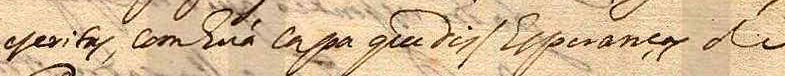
escritas, com huā capa que dis / Esperanças de
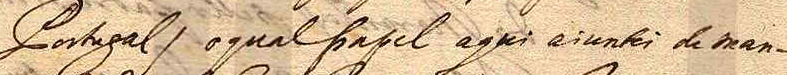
Portugal / o qual papel aqui aiuntei de man
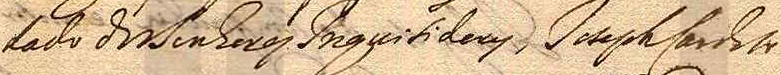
dado dos Senhores Inquisidores, Ioseph Cardoso
